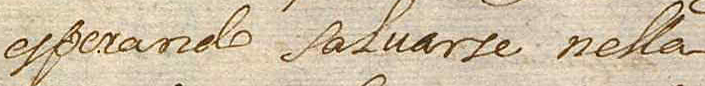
esperando saluarse nella
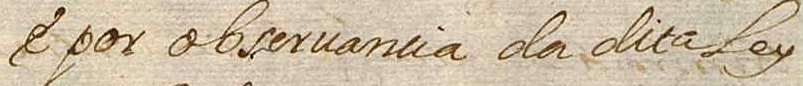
& por obseruancia da dita Ley
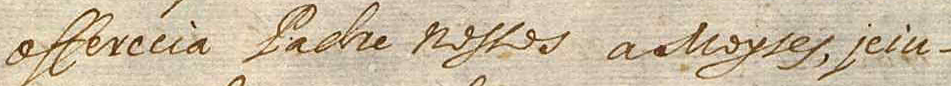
offerecia Padre nossos a Moyses, jeiu
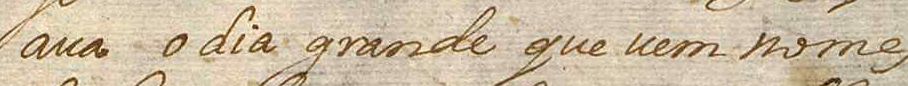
aua o dia grande que uem no mes
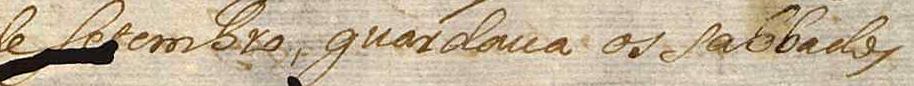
de setembro, guardaua os sabbados
